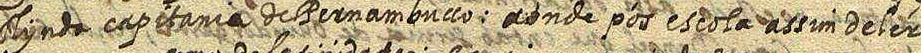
Olynda capitania de Pernambucco : aonde pós escola assim de ler
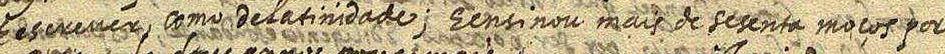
E escreuer como de latinidade; E ensinou mais de sesenta moços por
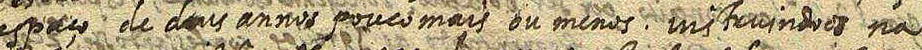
espaço de dous annos pouco mais ou menos . instruindoos na
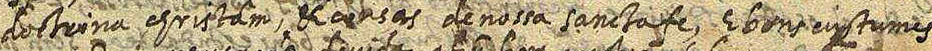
doctrina christām, & cousas de nossa sancta fe, E bons custumes
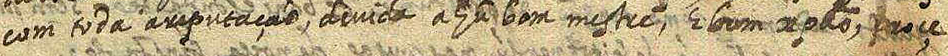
com toda a reputaçaõ, deuida a hū bom mestre, E bom xpaõ, proçe
